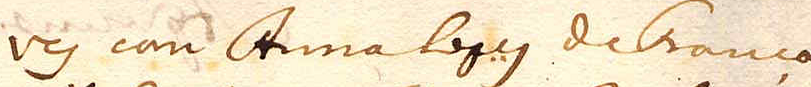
ves com Anna lopes de França
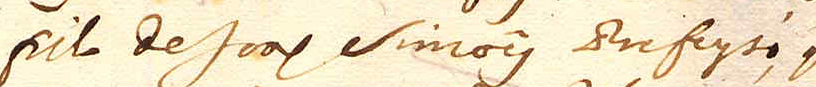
filho de Joaõ Simoẽs prefeyto, q
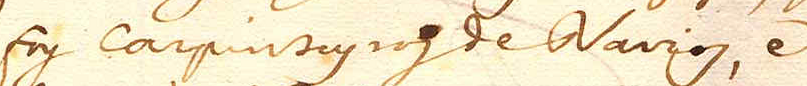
foy carpinteyros de Navios, e
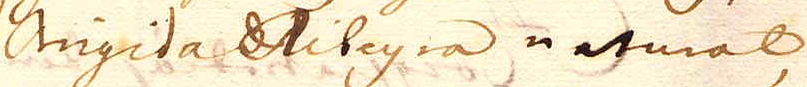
Brigida Ribeyra natural
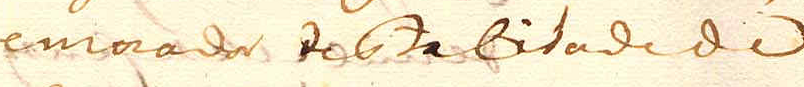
e morador desta Cidade de
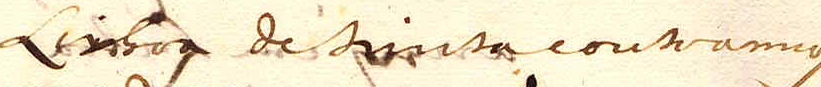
Lisboa de trinta e outo annos
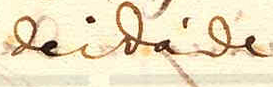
de idade
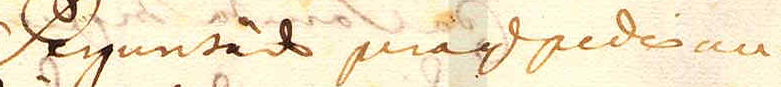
Perguntado pera q̄ pedio au
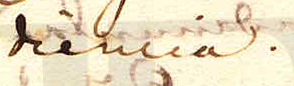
diencia.
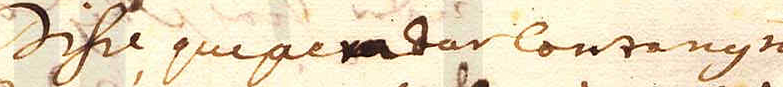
Disse, que pera dar conta nest
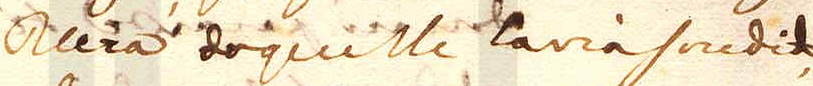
Meza do que lhe havia socedido,
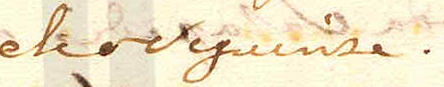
e he o seguinte.
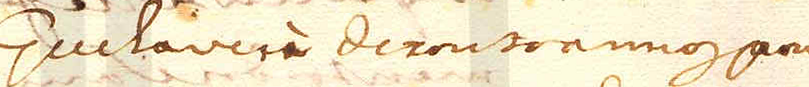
Que haverá dezouto annos pou
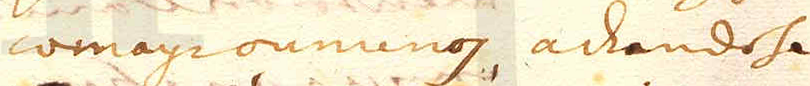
co mays ou menos, achandose
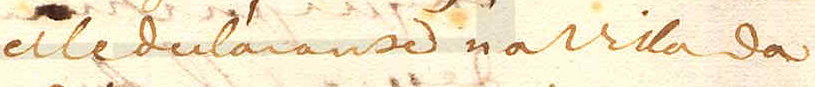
elle declarante na Villa da
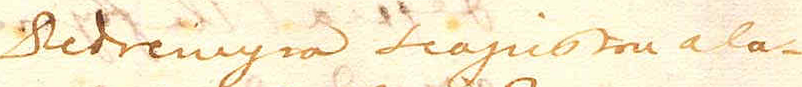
Pedreneyra se ajustou a Ca
